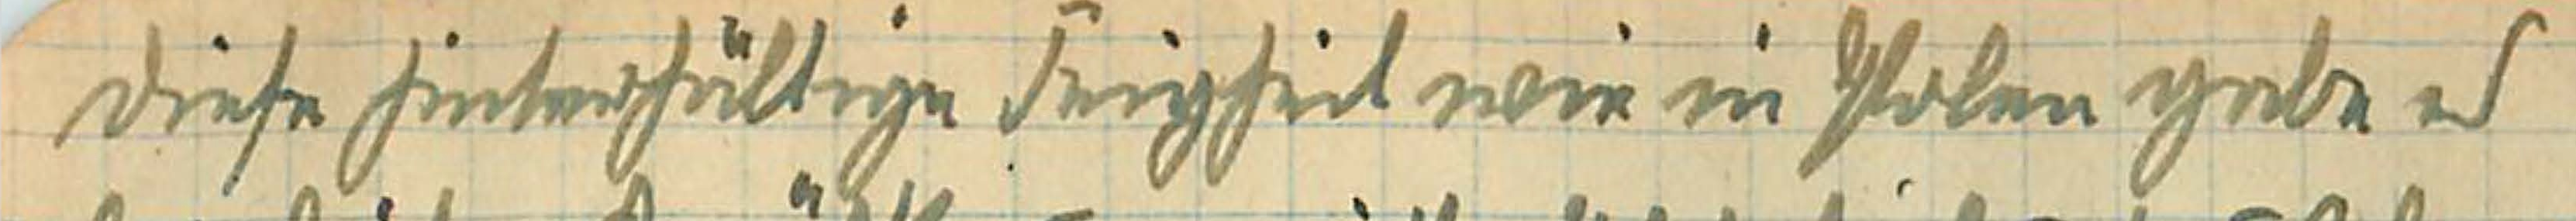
Diese hinterhältige Feigheit wie in Polen gabe es
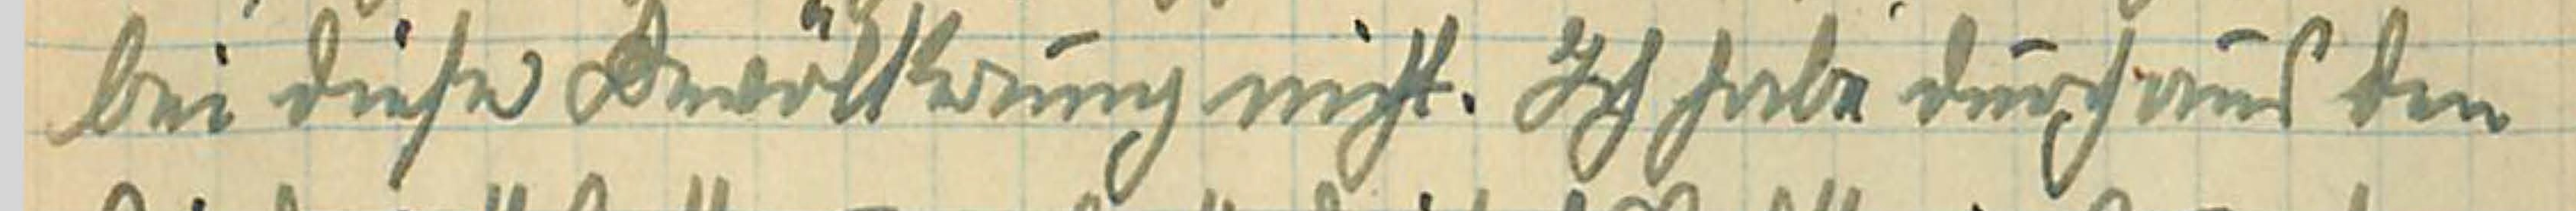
bei dieser Bevölkerung nicht. Ich habe durchaus den
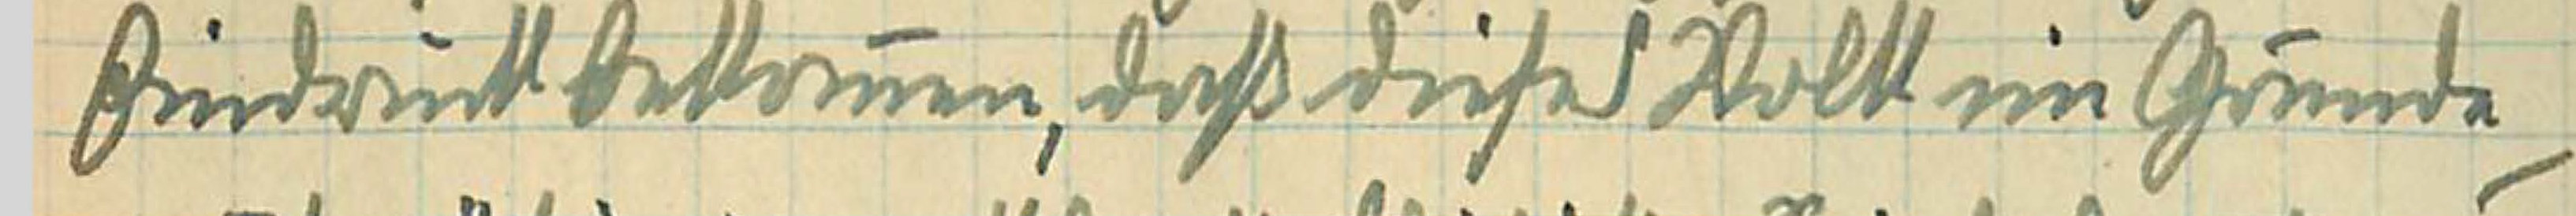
Eindruck bekommen daß dieses Volk im Grunde
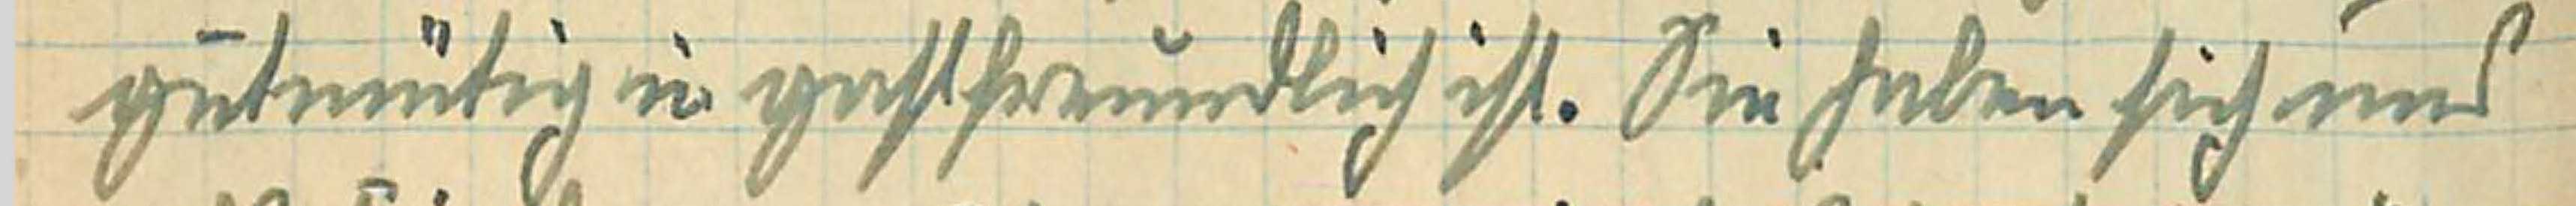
gutmütig u. gastfreundlich ist. Sie haben sich uns
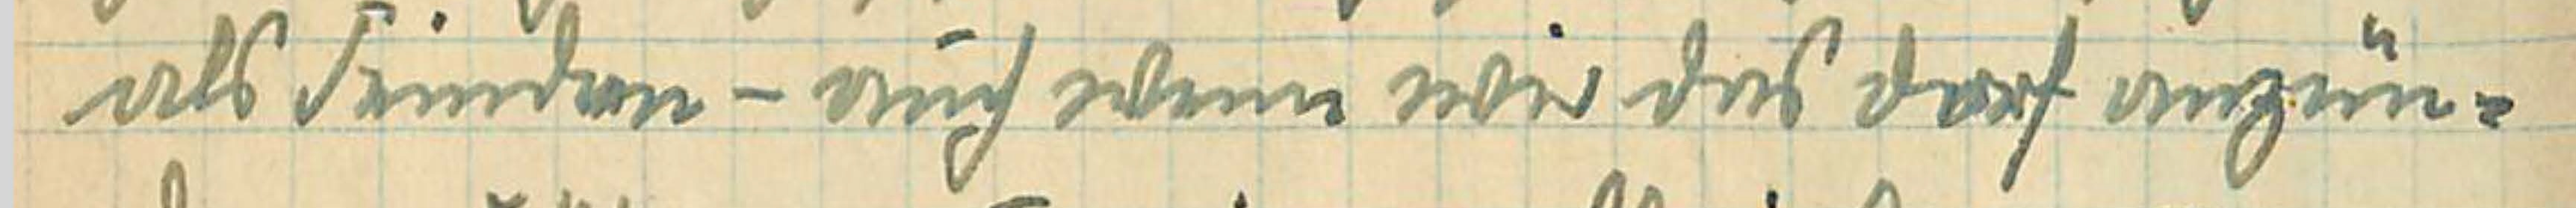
als Feinden – auch wenn wir das Dorf anzün-
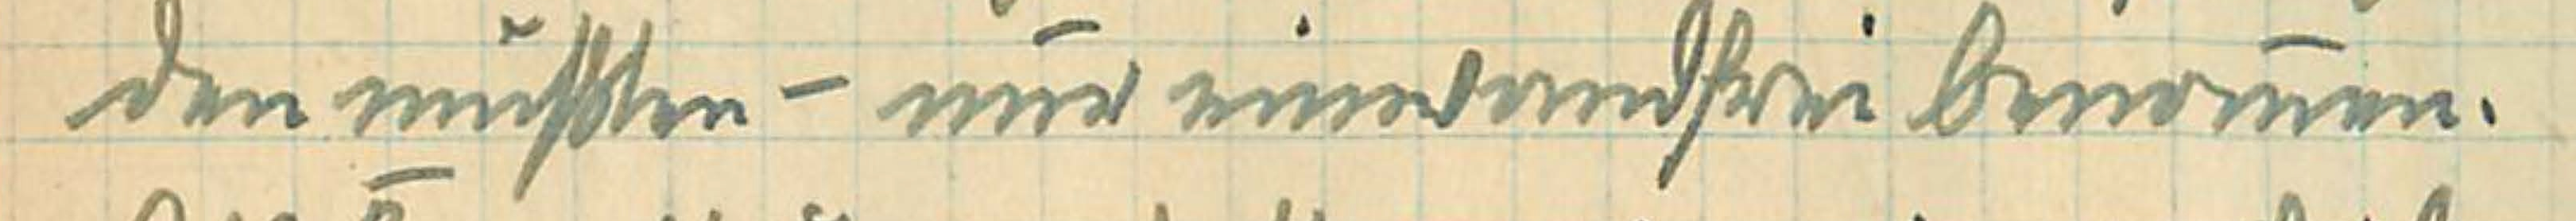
den mußten – nur einwandfrei benommen.
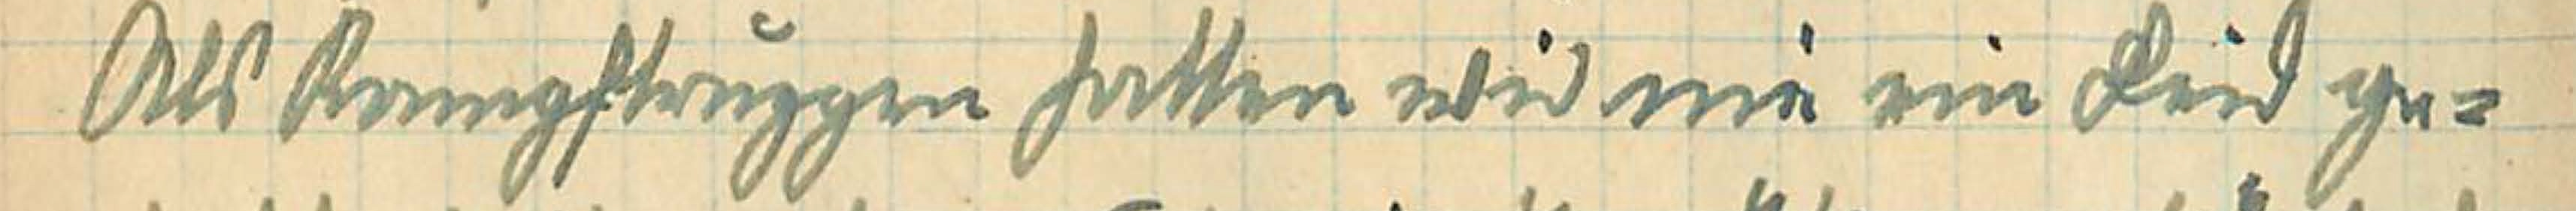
Als Kampftruppen hatten wir nie ein Leid ge-
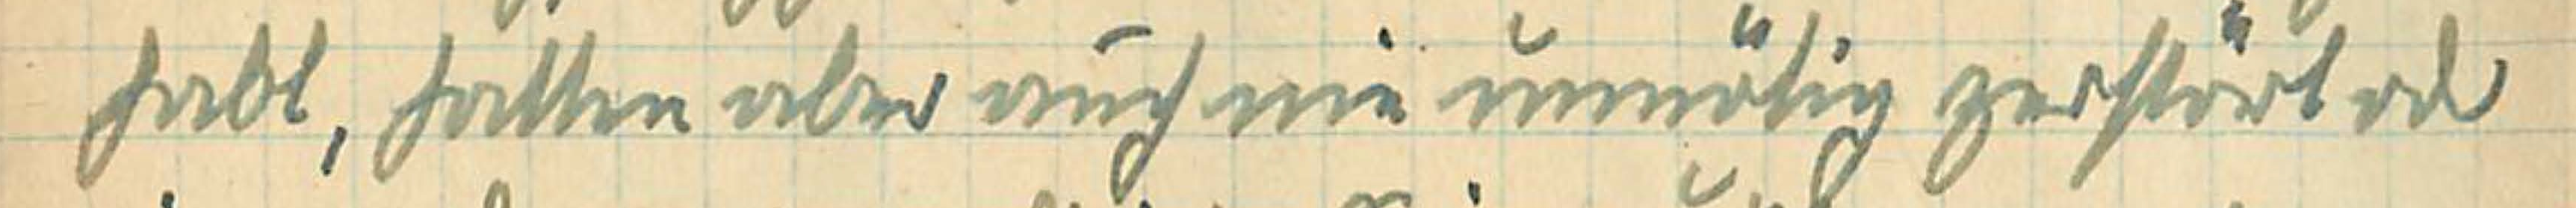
habt, hatten aber auch nie unnötig zerstört oder
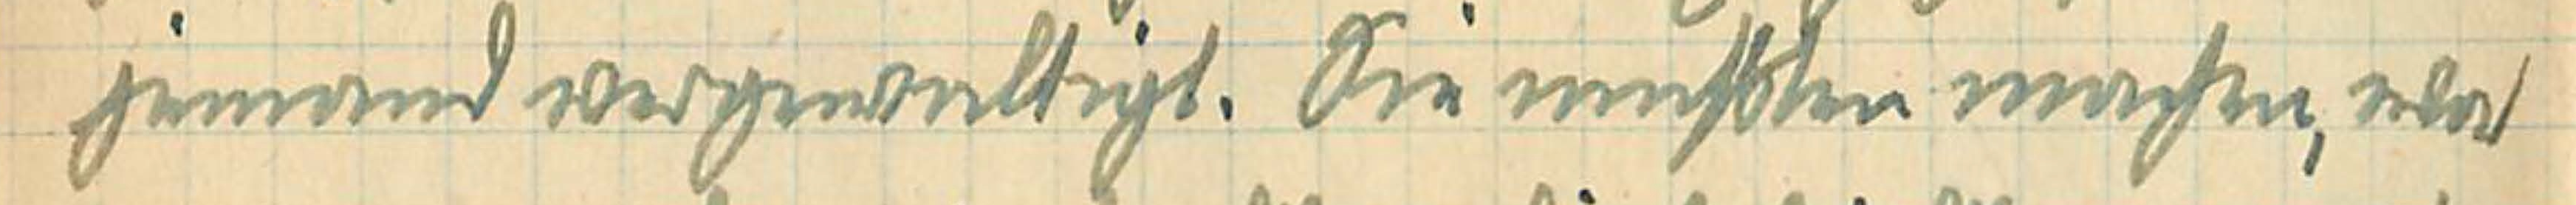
jemand vergewaltigt. Sie mußten machen, was
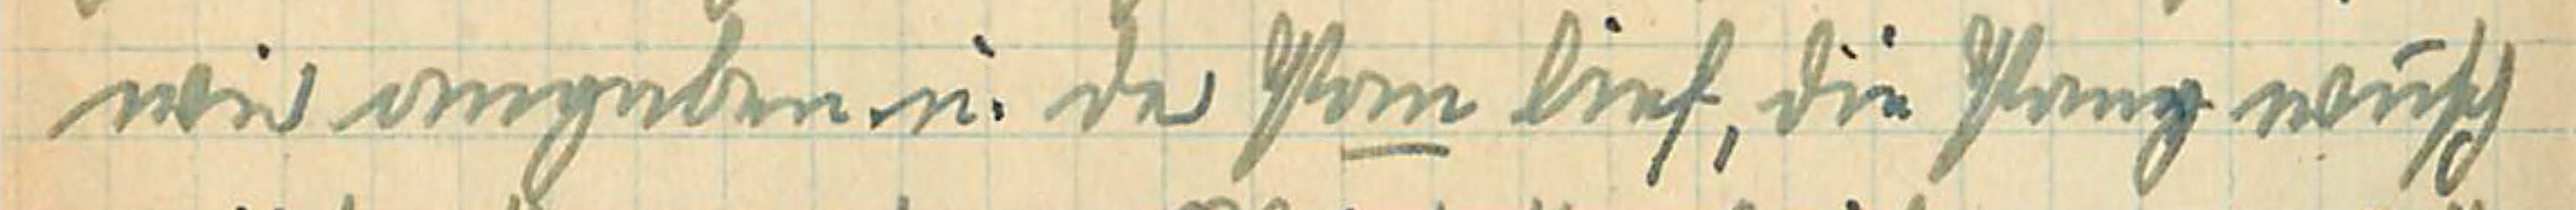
wir angaben u. der Pan lief, die Pany wusch
